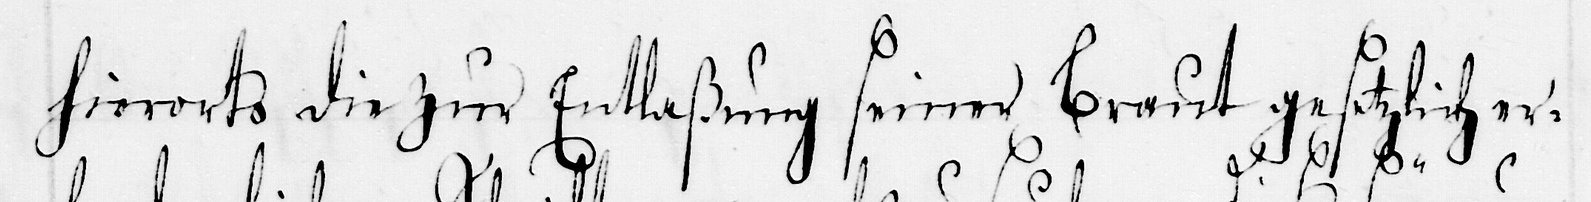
hierorts die zur Entlaßung seiner Braut gesetzlich er¬
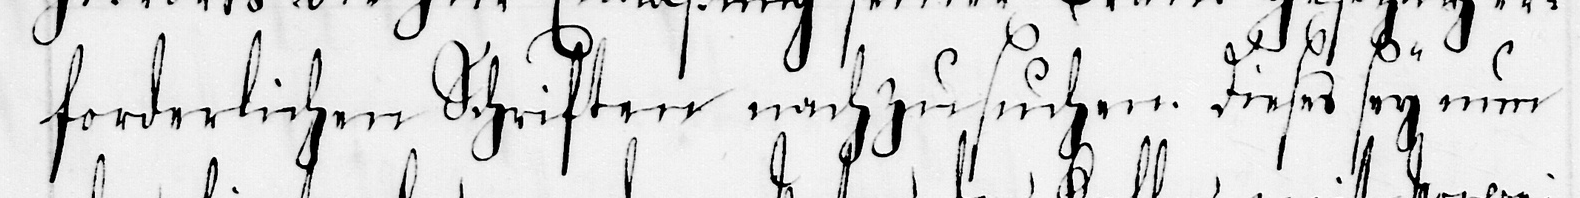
forderlichen Schriften nachzusuchen. Dieses sey nun
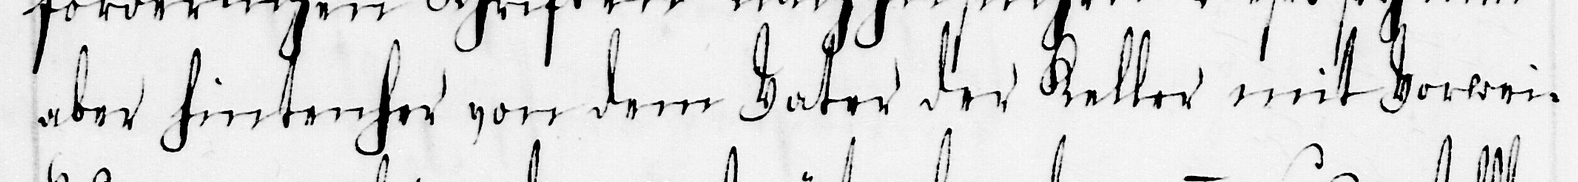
aber hintenher von dem Vater der Keller mit Vorwei¬
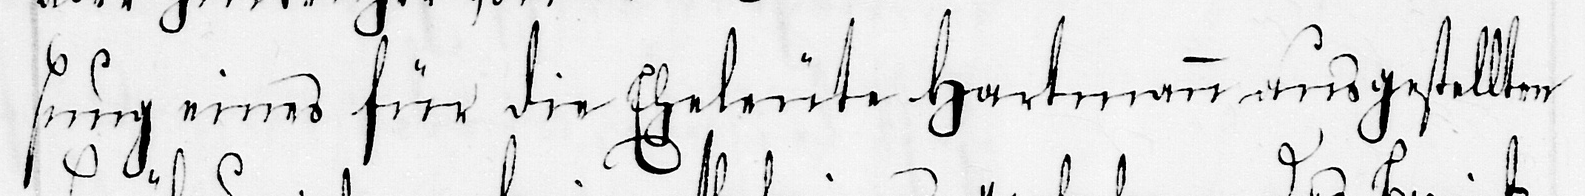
sung eines für die Eheleute Hartmann ausgestellten
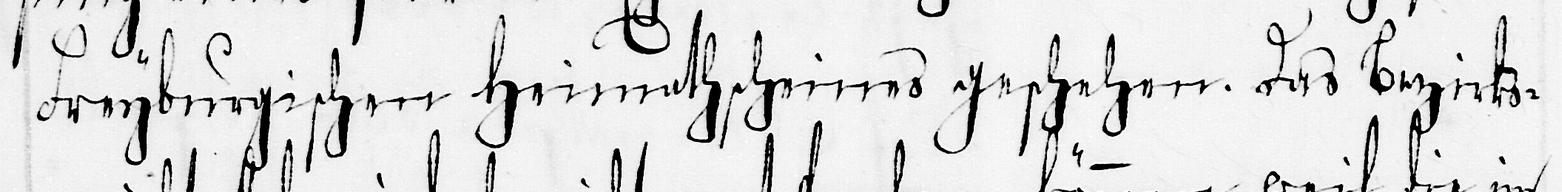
Freyburgischen Heimathscheines geschehen. Das Bezirks¬
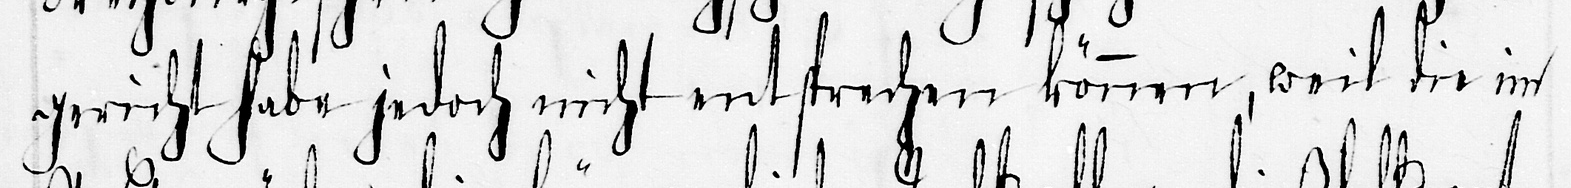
gericht habe jedoch nicht entsprechen können, weil die im
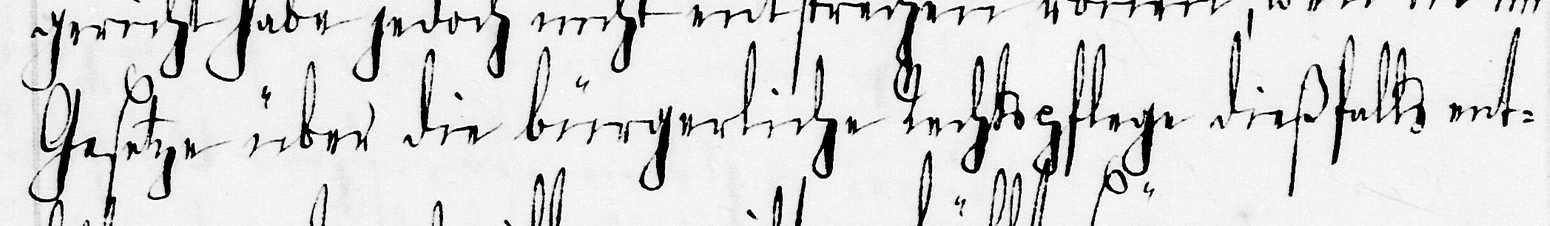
Gesetze über die bürgerliche Rechtspflege dießfalls e¬
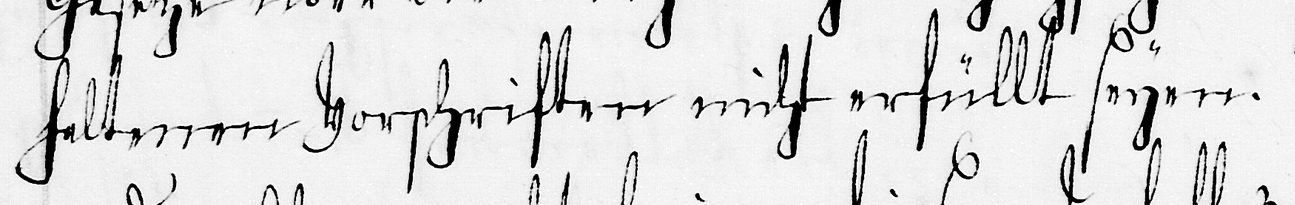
thaltenen Vorschriften nicht erfüllt seyen.
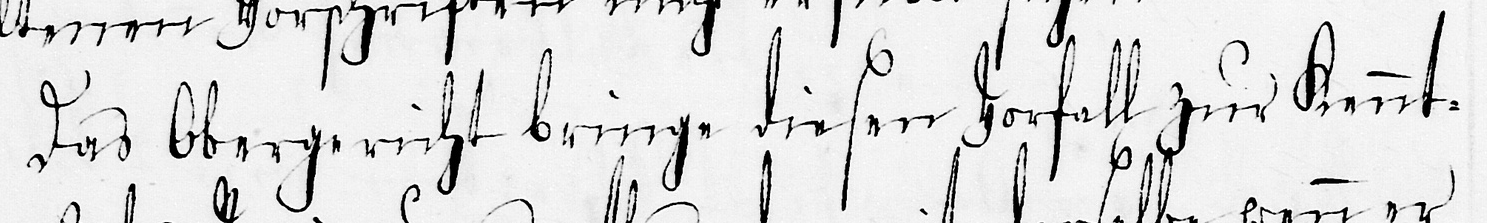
Das Obergericht bringe diesen Vorfall zur Kennt¬
